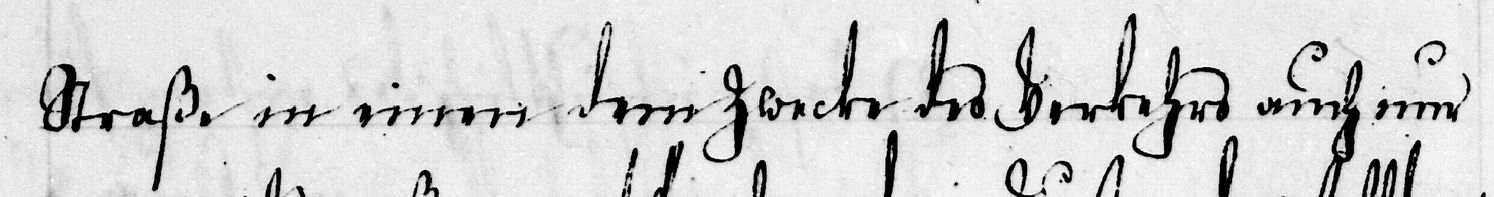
Straße in einen dem Zwecke des Verkehrs auch nur
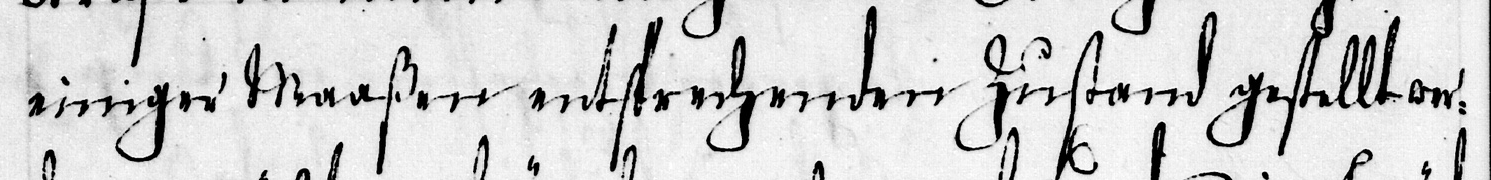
einiger Maaßen entsprechenden Zustand gestellt we¬
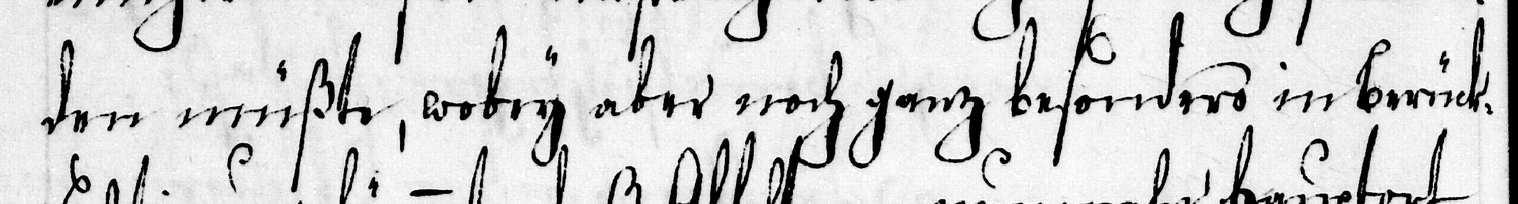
rden müßte, wobey aber noch ganz besonders in Berück¬
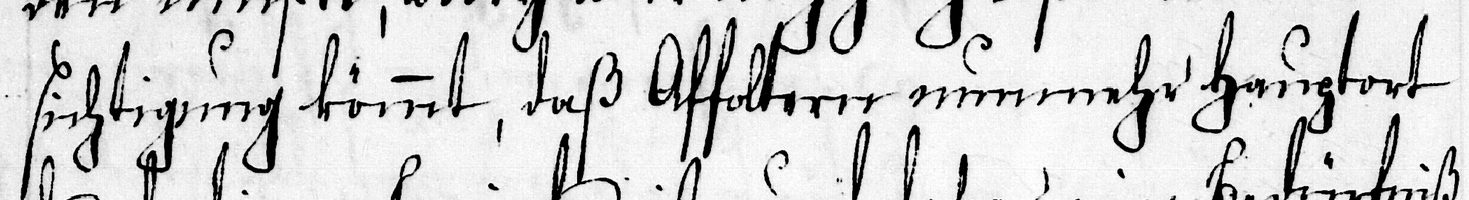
sichtigung kömmt, daß Affoltern nunmehr Hauptort
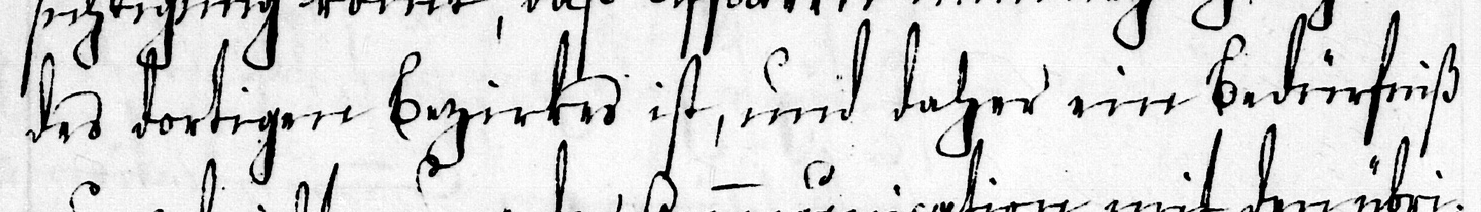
des dortigen Bezirkes ist, und daher ein Bedürfniß
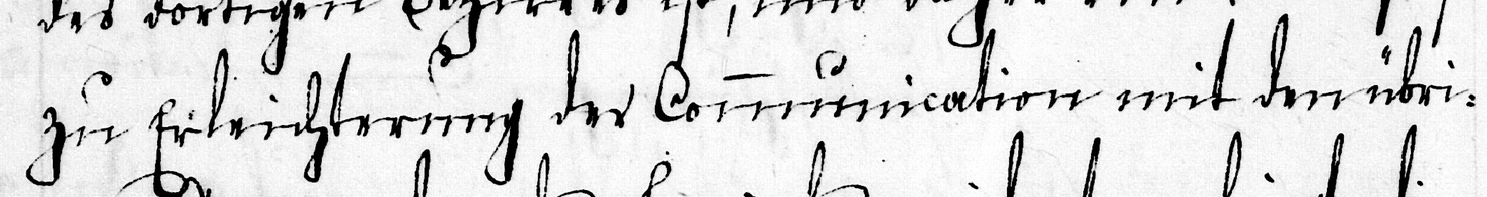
zu Erleichterung der Communication mit den übri¬
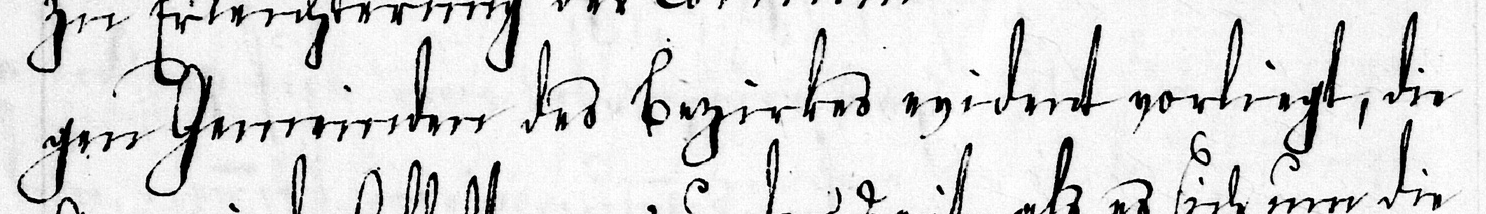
gen Gemeinden des Bezirkes evident vorliegt, die
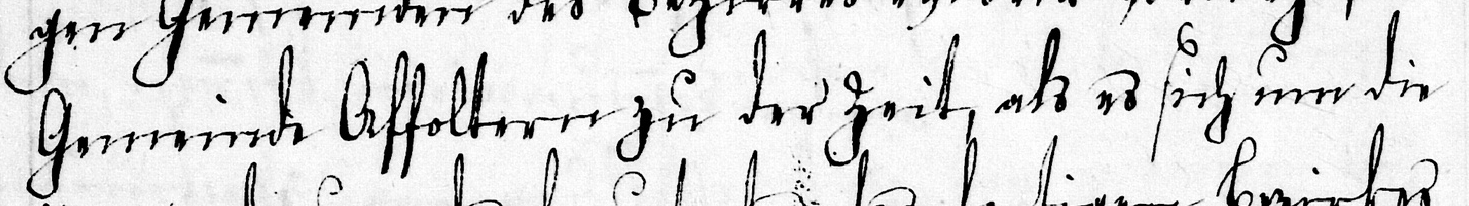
Gemeinde Affoltern zu der Zeit, als es sich um die
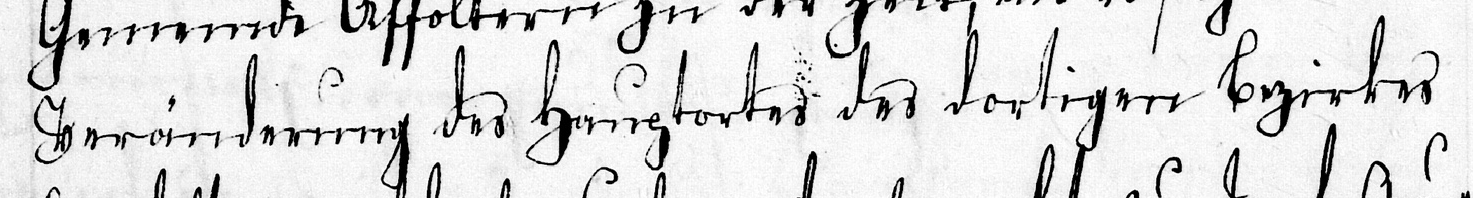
Veränderung des Hauptortes des dortigen Bezirkes
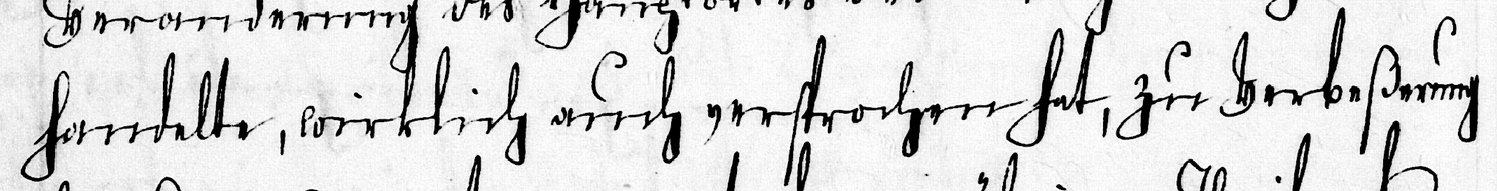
handelte, wirklich auch versprochen hat, zu Verbeßerung
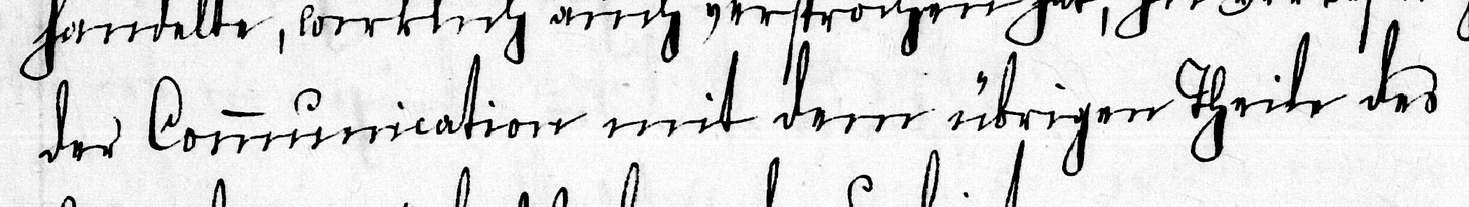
der Communication mit dem übrigen Theile des
